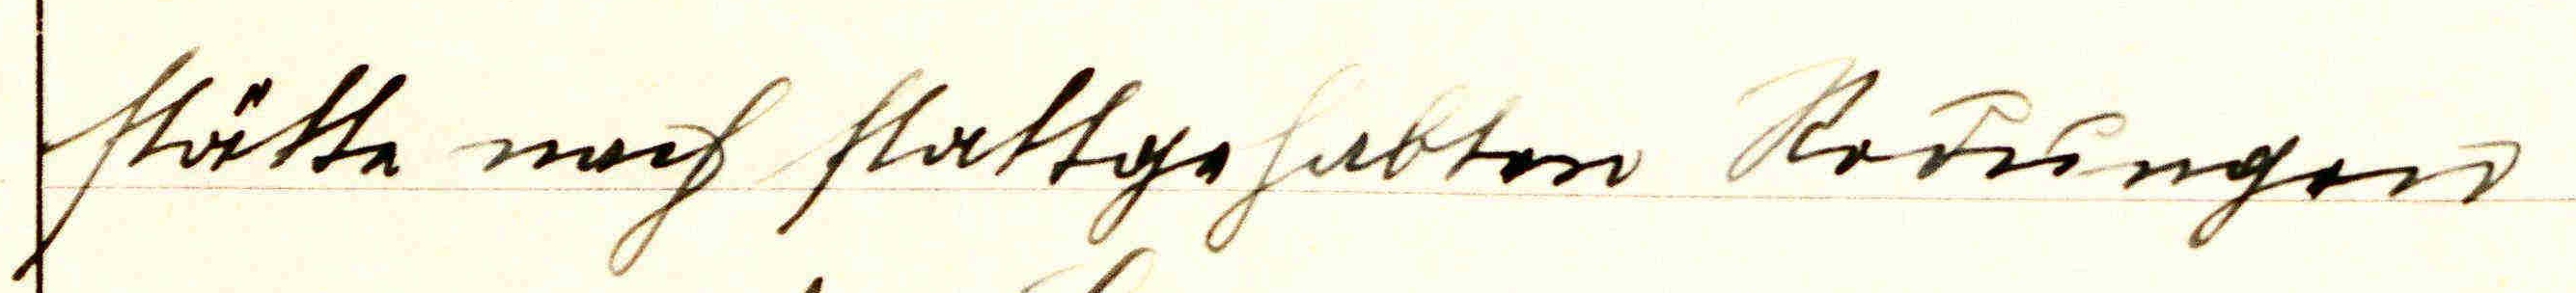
stätte nach stattgehabten Rodungen
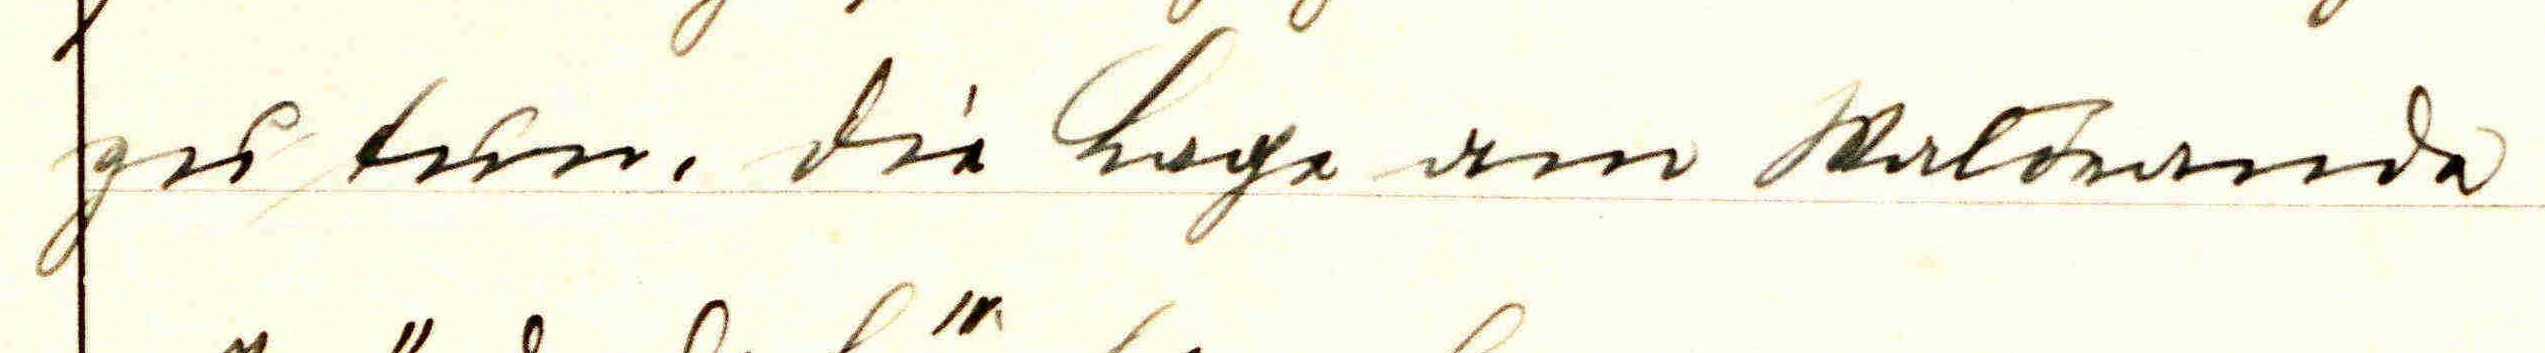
zu tun. Die Lage am Waldrande
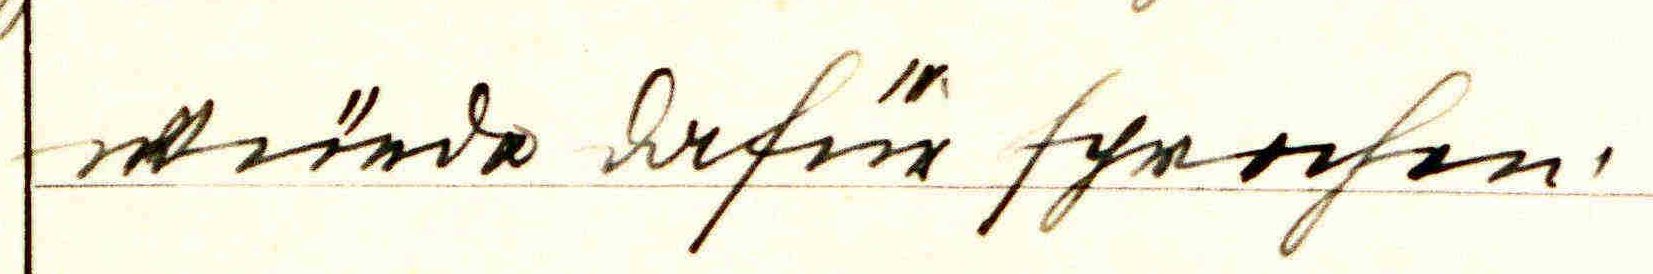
würde dafür sprechen.
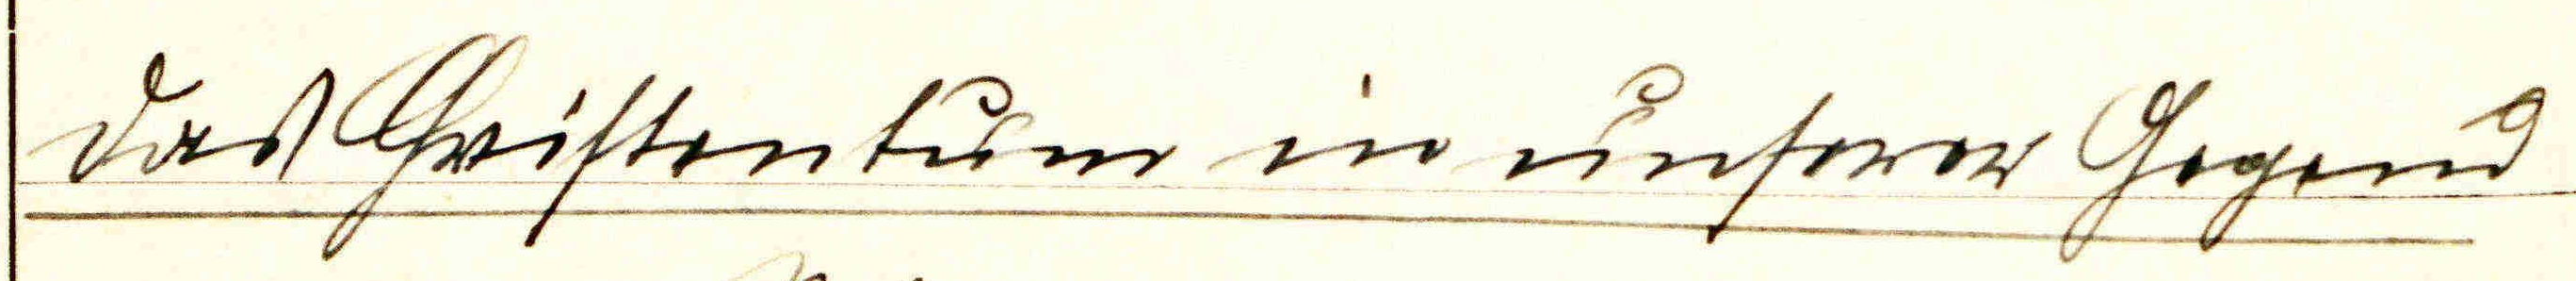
Das Christentum in unserer Gegend
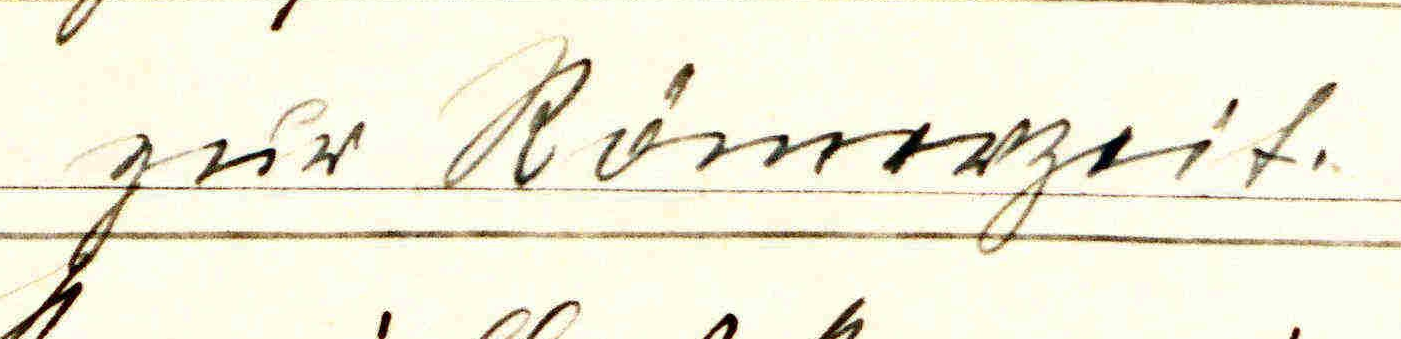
zur Römerzeit.
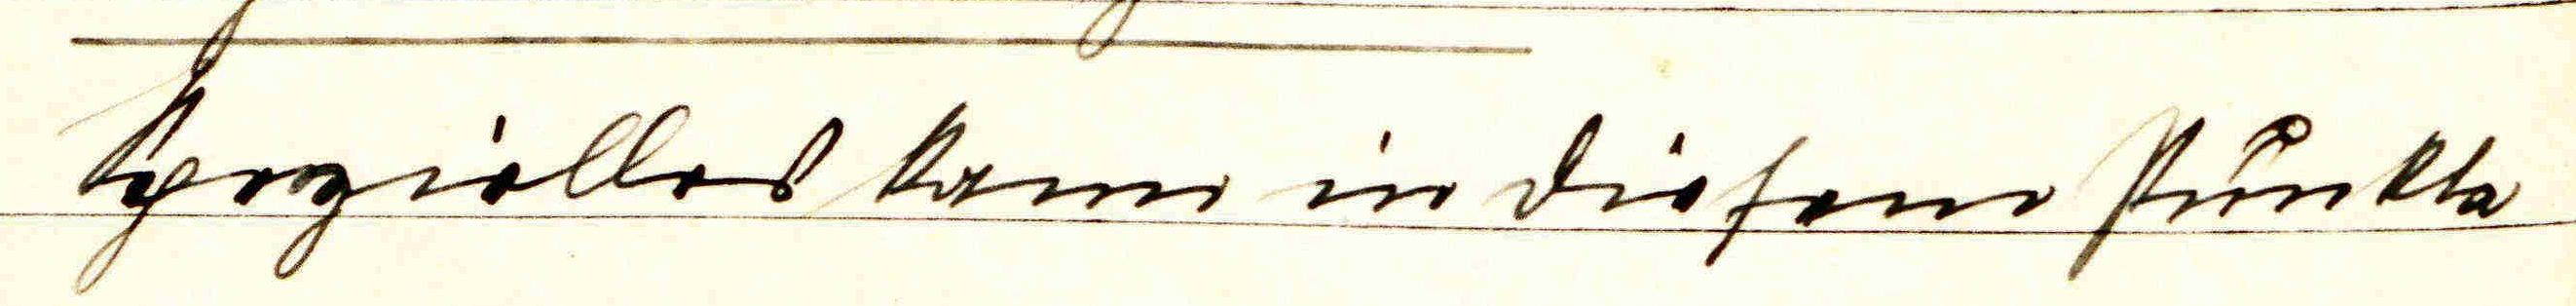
Spezielles kann in diesem Punkte
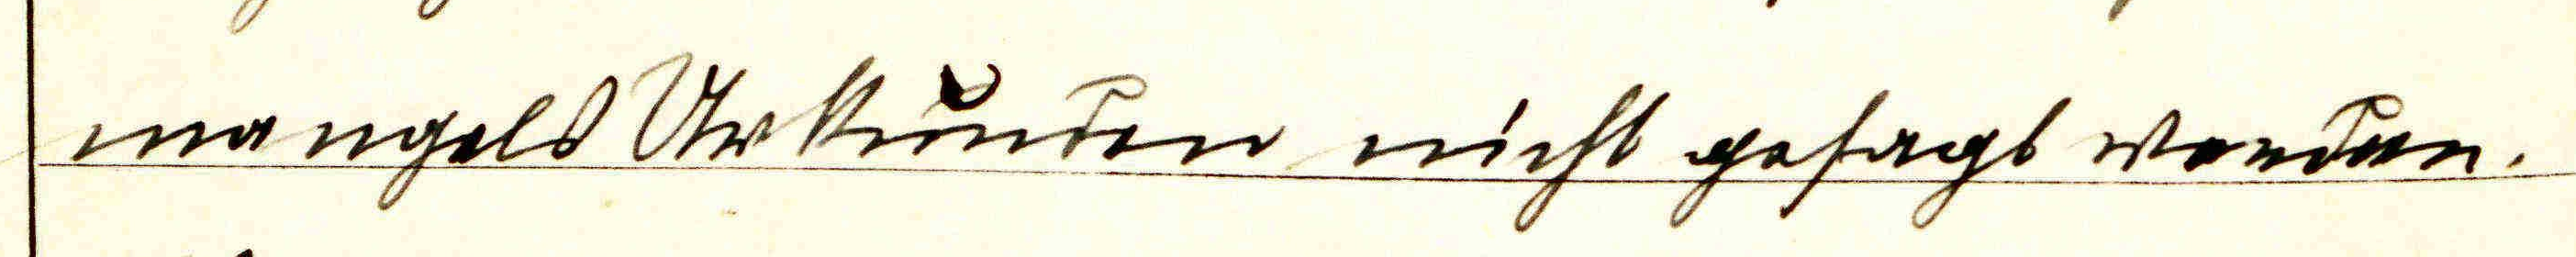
mangels Urkunden nicht gesagt werden.
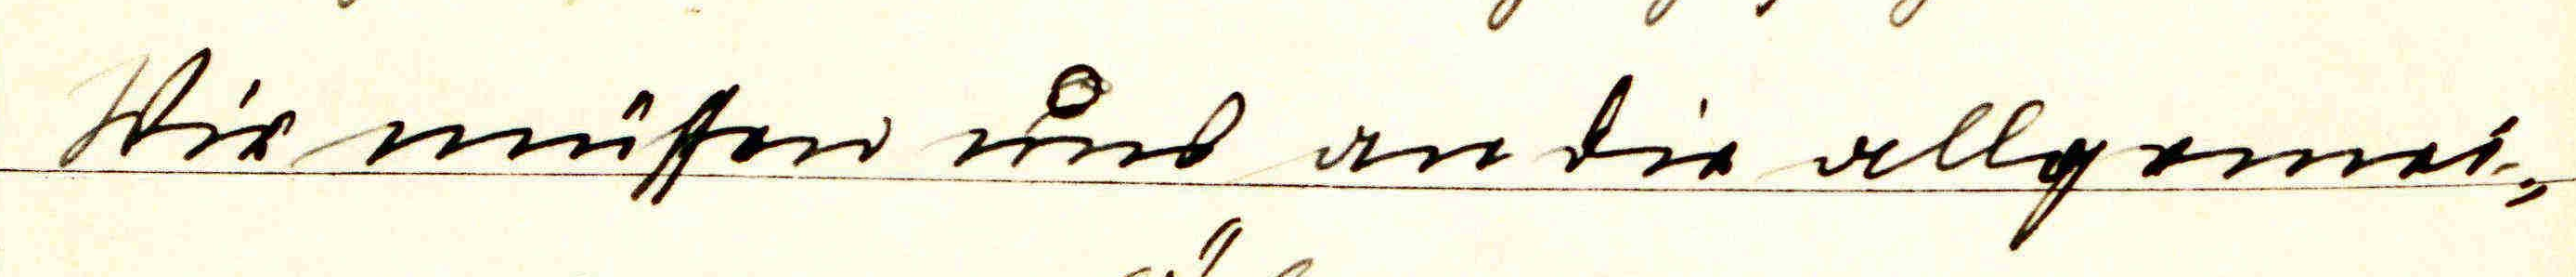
Wir müssen uns an die allgemei-
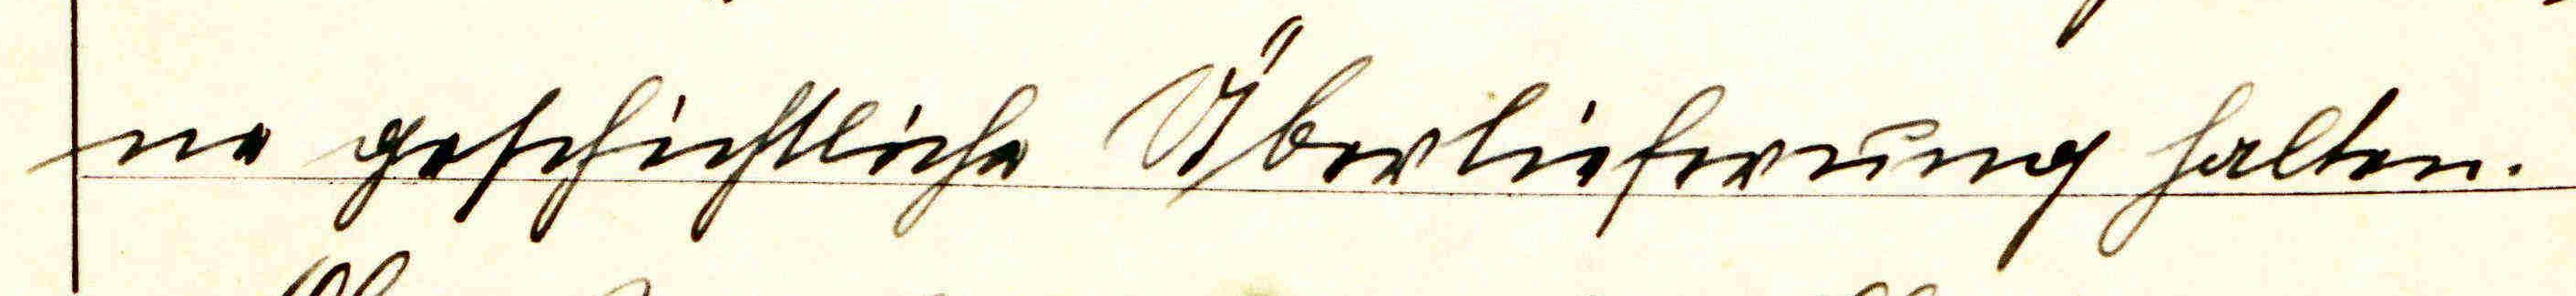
ne geschichtliche Überlieferung halten.
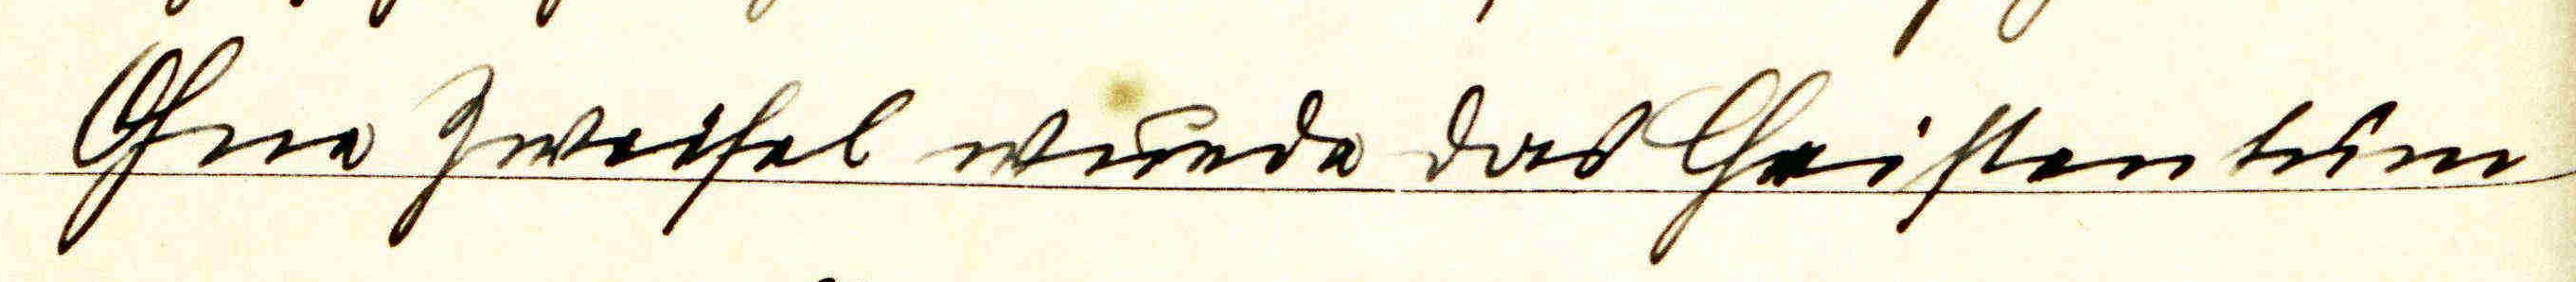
Ohne Zweifel wurde das Christentum
